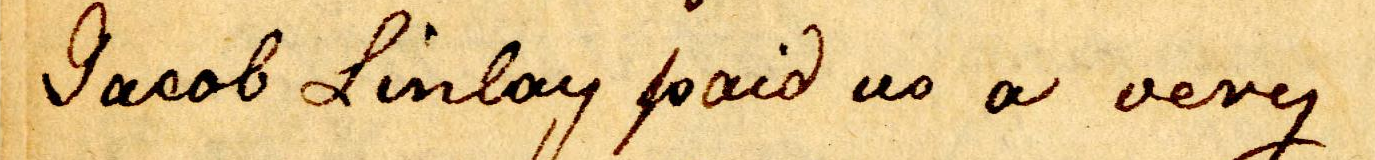Jacob Linlay paid us a very
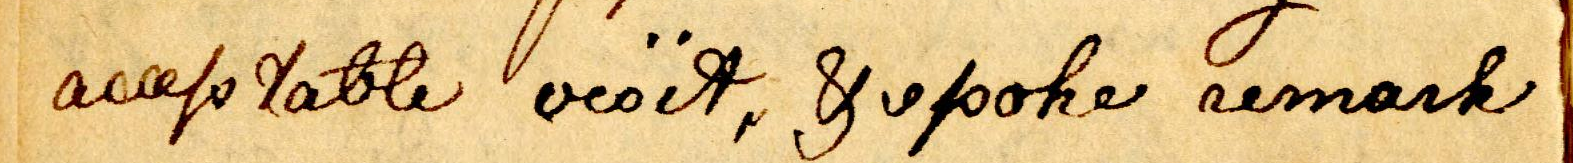acceptable visit, & spoke remark
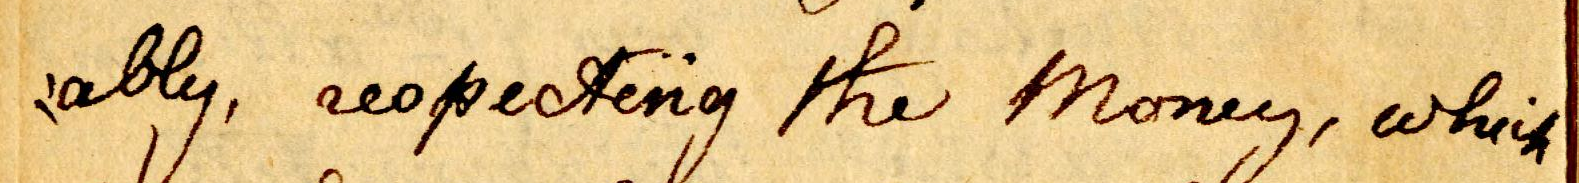-ably, respecting the Money, which
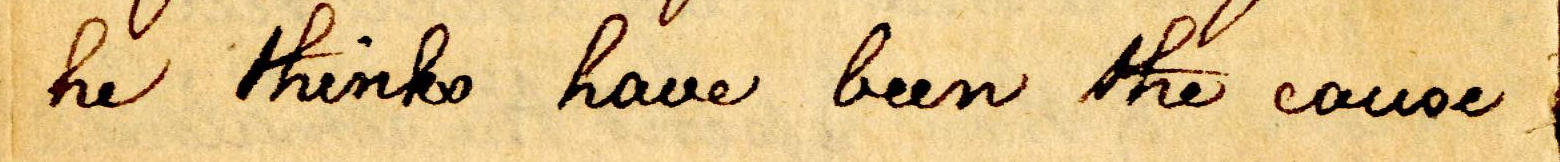he thinks have been the cause
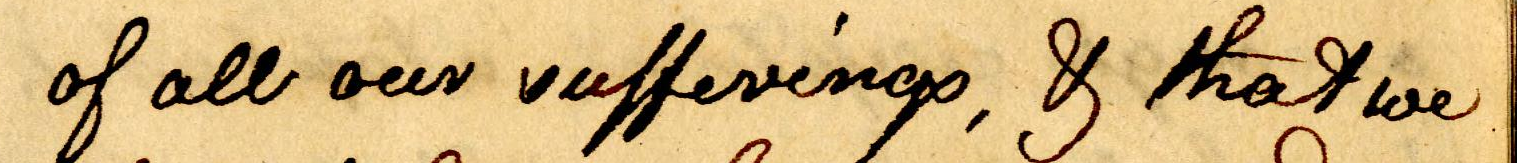of all our sufferings, & that we
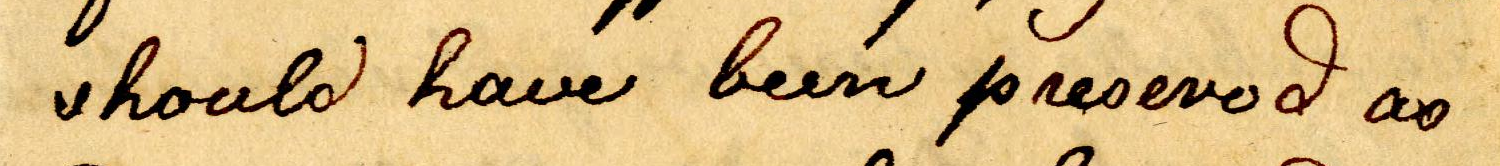should have been preseved as
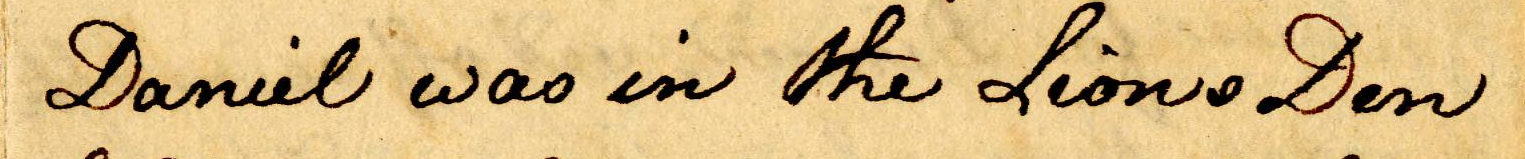Daniel was in the Lions Den
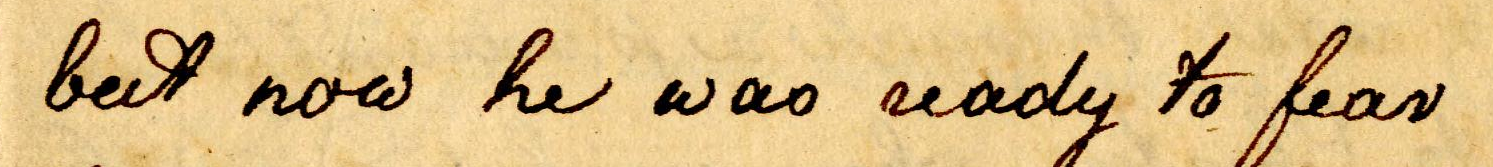but now he was ready to fear
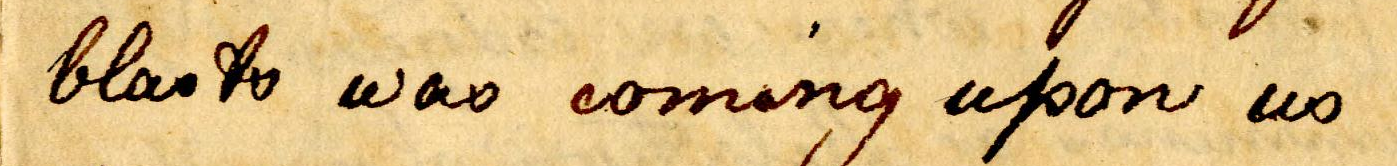blasts was coming upon us
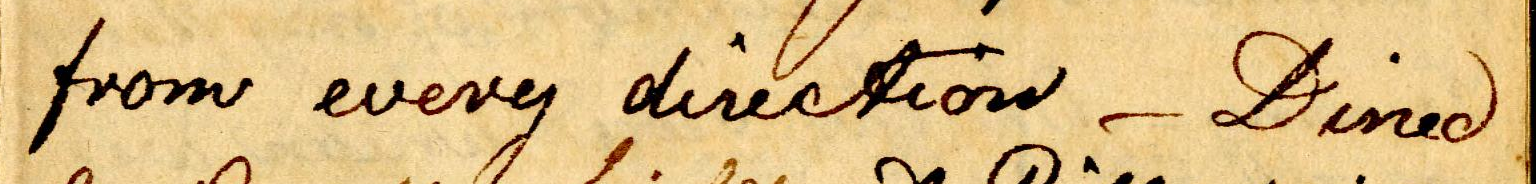from every direction- Dined
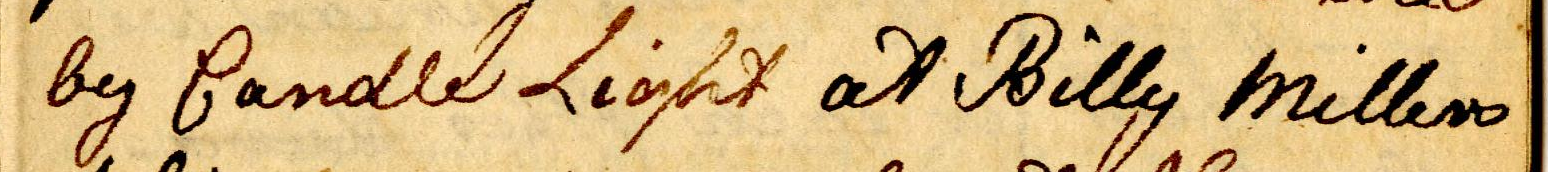by Candle Light at Billy Millers
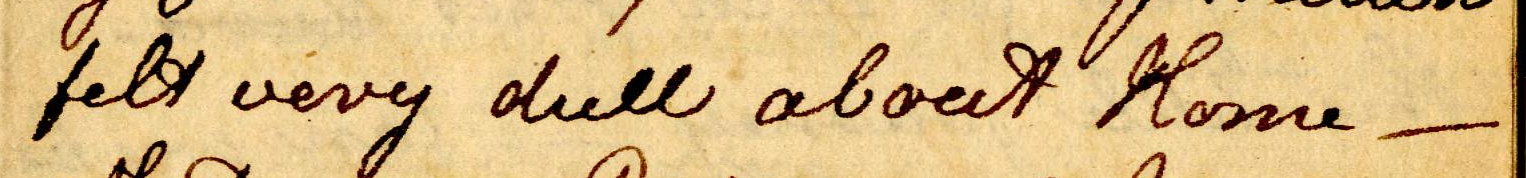felt very dull about Home-
